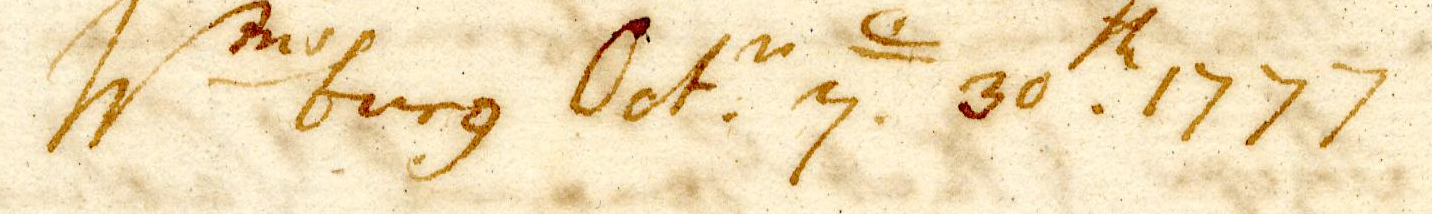W^msburg Oct^r. y^e 30^th. 1777
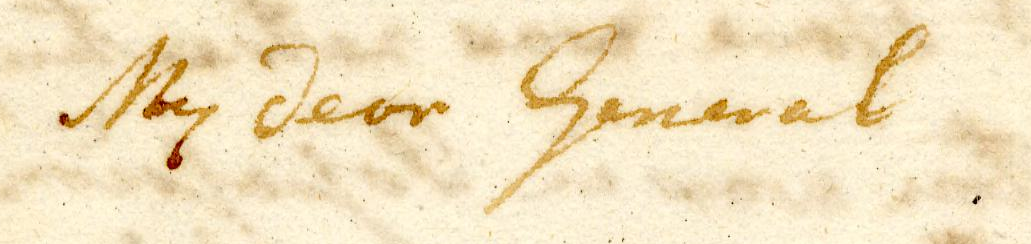My dear General
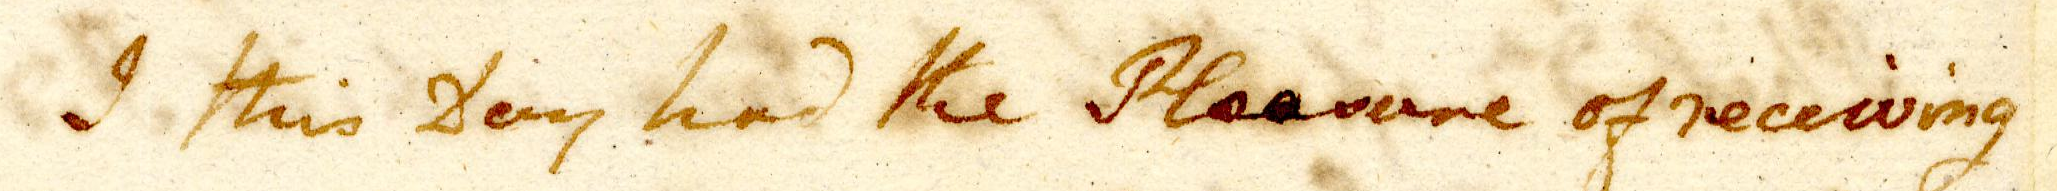I this Day had the Pleasure of receiving
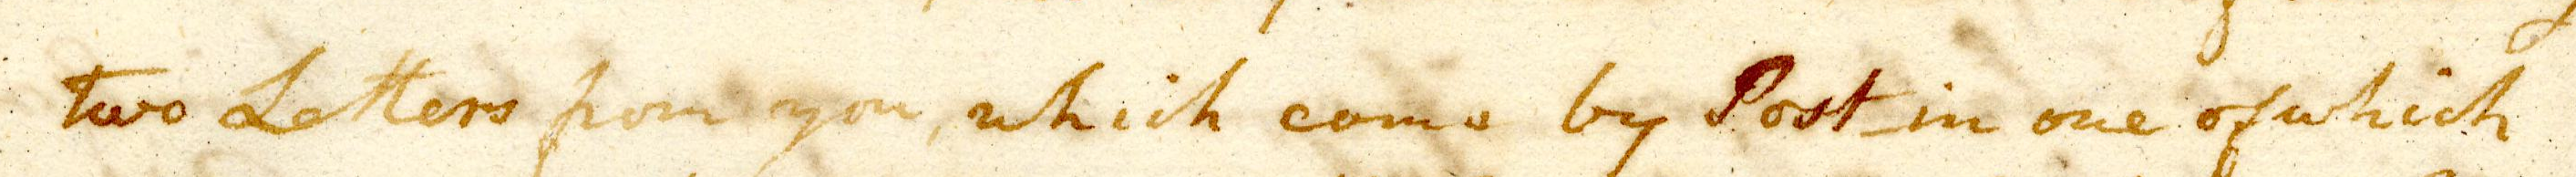two Letters from you which came by Post- in one of which
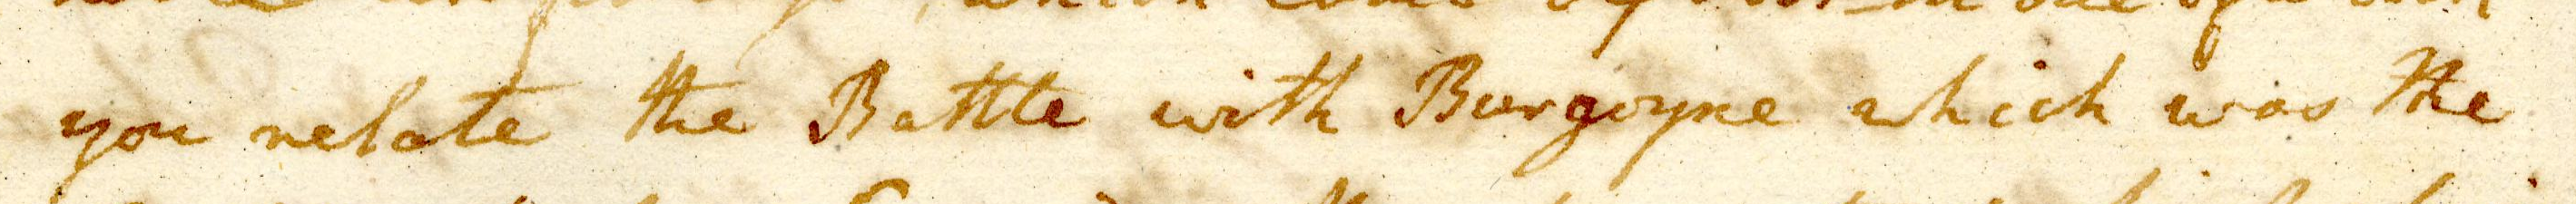you relate the Battle with Burgoyne which was the
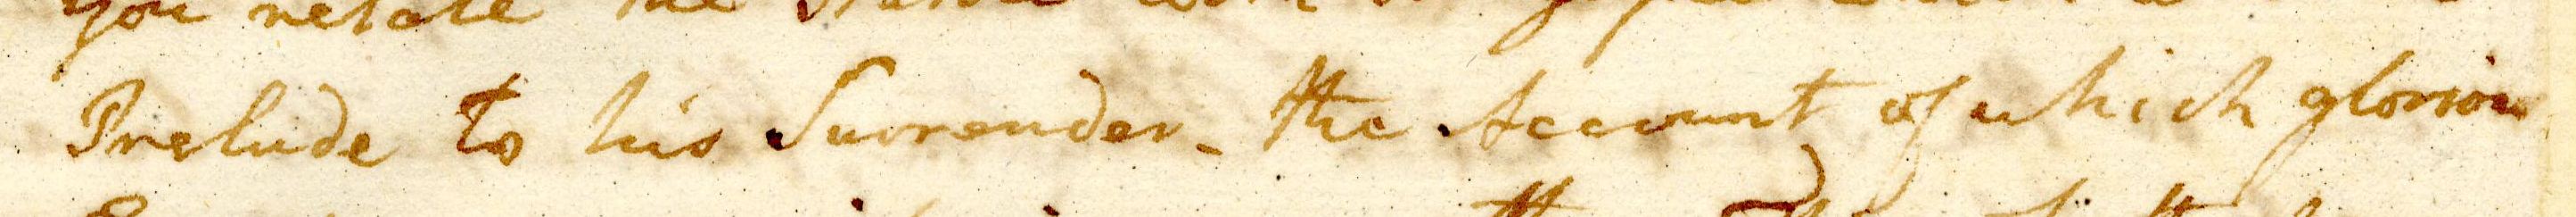Prelude to his Surrender. the Account of which glorious
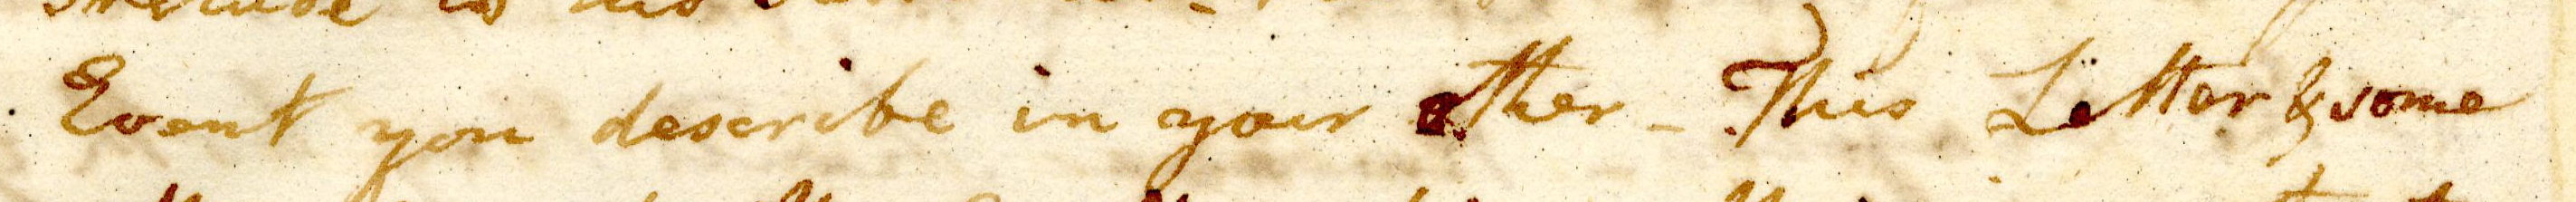Event you describe in your other- This Letter & some
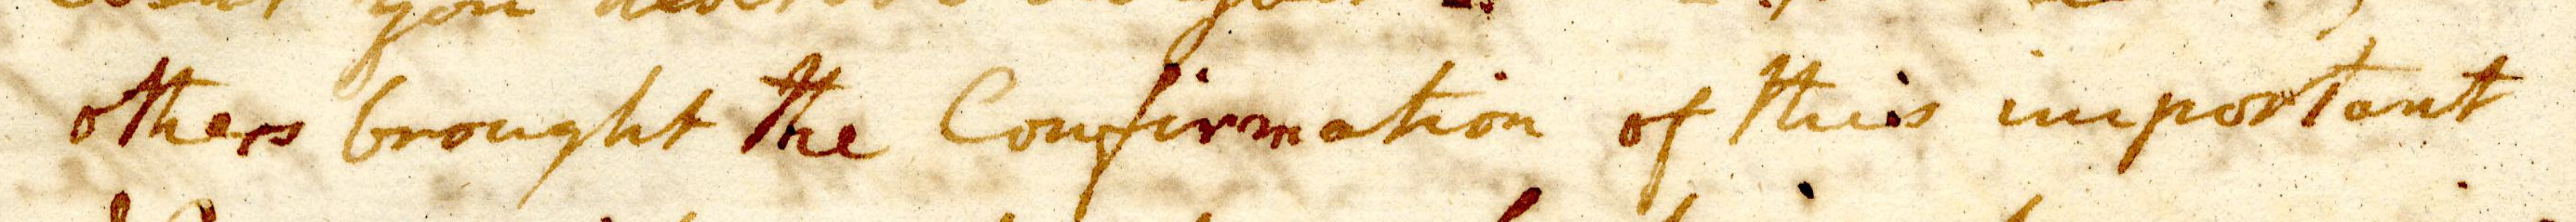others brought the Confirmation of this important
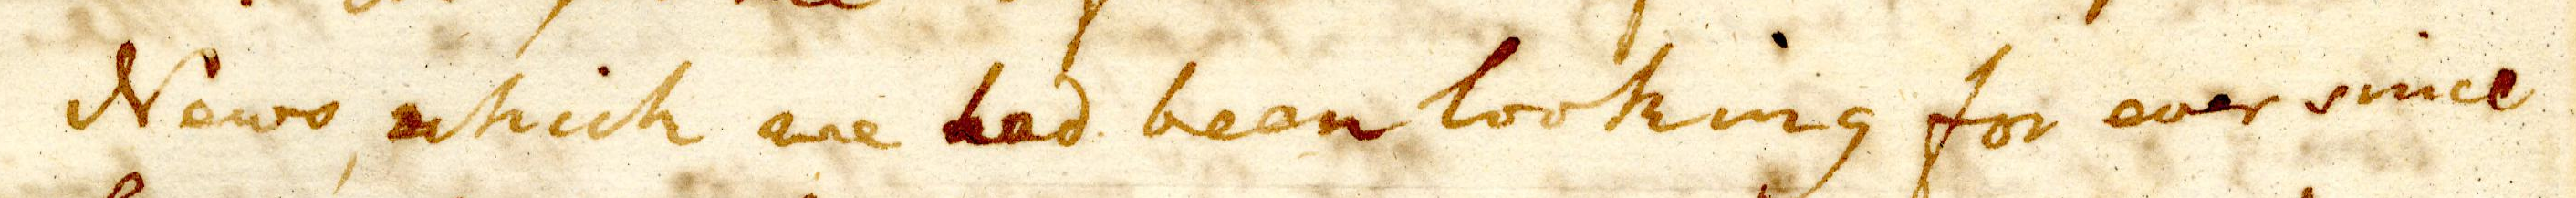News, which we had been looking for ever since
